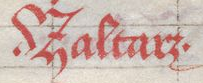.Żaltarz.
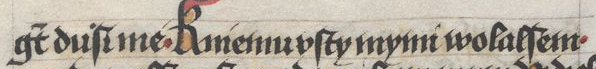ḡt duẛi mé.Kniemu vſty mymi wolalſem.
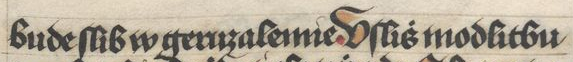bude ſlib w geruzalemie.Vſliṡ modlitbu
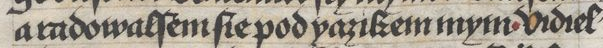a radowalſem ſie pod yazikem mym.Vidiel
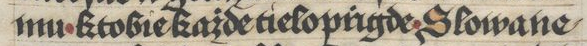mu.ktobie każde tielo pṙigde.Slowa ne¬
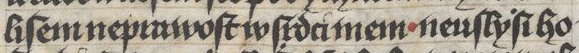li ſem neprawoſt wſrdci mem.neuſlyẛi ho¬
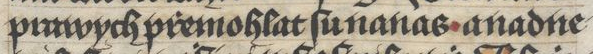prawych pṙemohlat ſu nanas.a nadne¬
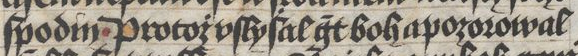ſpodin.Protoż uſlyſal ḡt boh a pozorowal
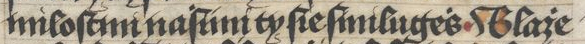miloſtmi naẛimi ty ſie ſmilugeṡ.Blaże¬
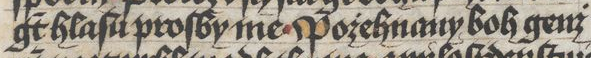ḡt hlaſu proſby me.Pożehnany boh genż
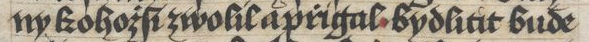ny kohożſi zwolil a pṙigal.bydlitit bude
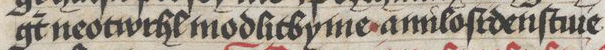ḡt neotwrhl modlitbyme.a miloſrdenſtuie
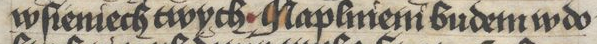wẛieniech twych.Naplnieni budem w do¬
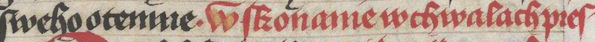ſweho otemne.Wſkonanie wchwalach pieſ¬
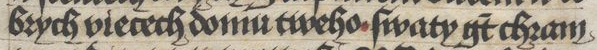brych viecech domu tweho.ſwaty ḡt chram
